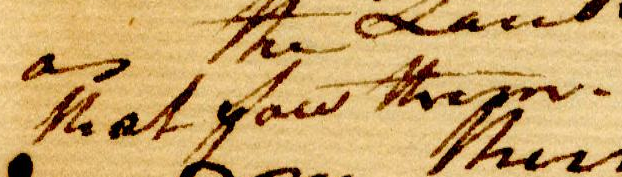that saw them.
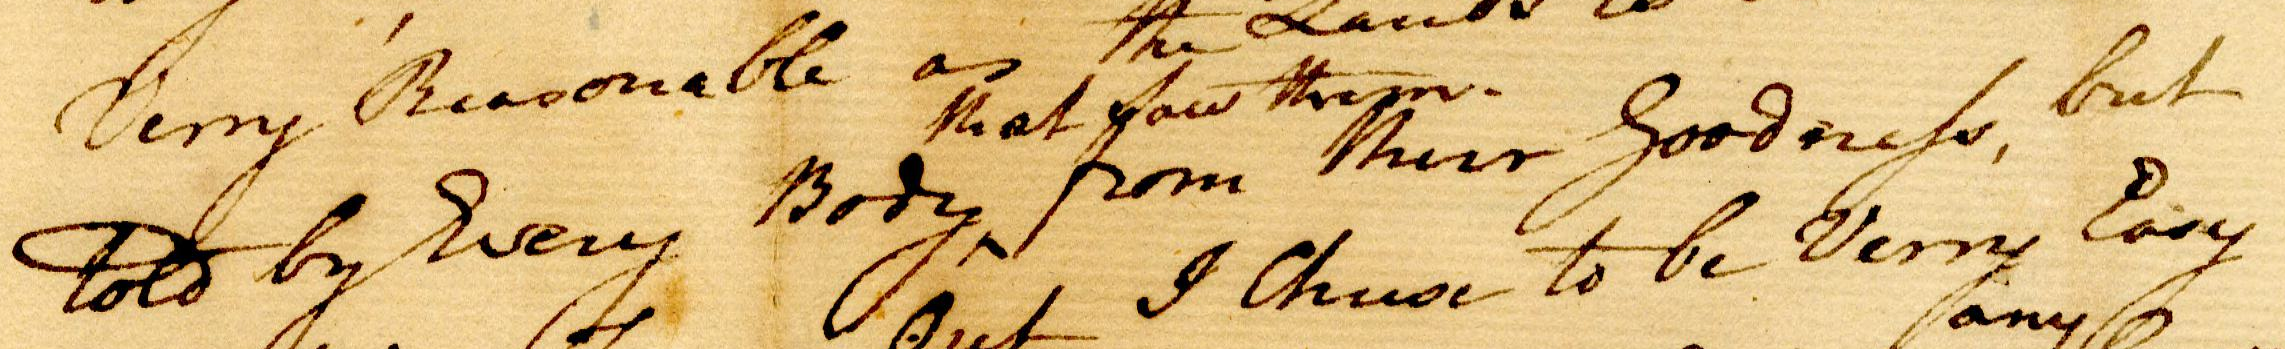told by Every Body ^ from their Goodness, but
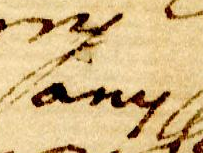any
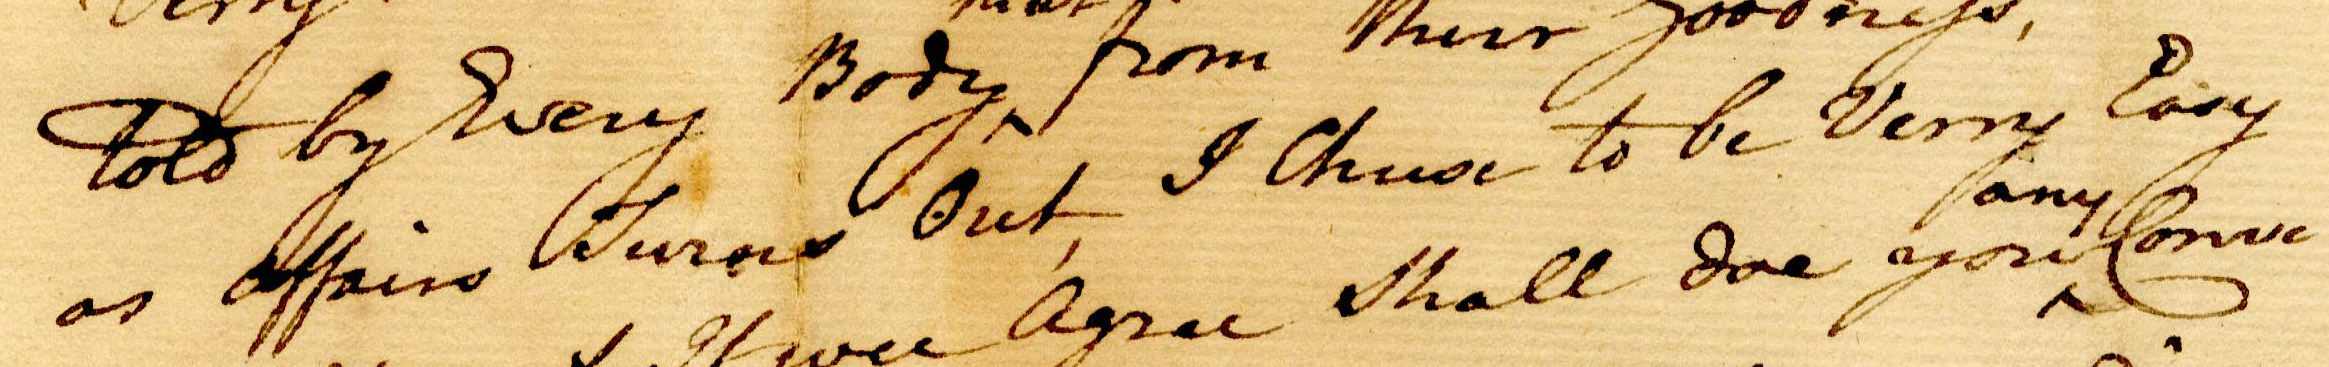as affairs Turns Out, I Chuse to be Verry Easy
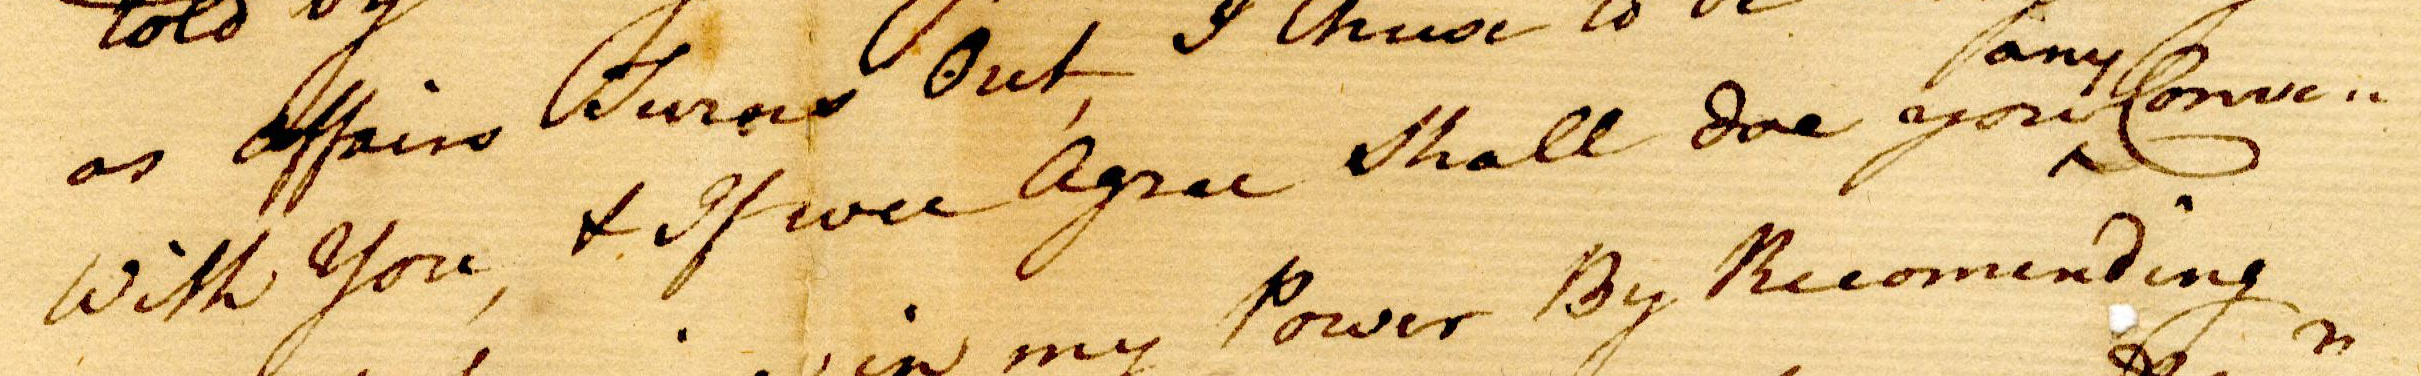with you, & If wee agree shall doe you ^ Conve-
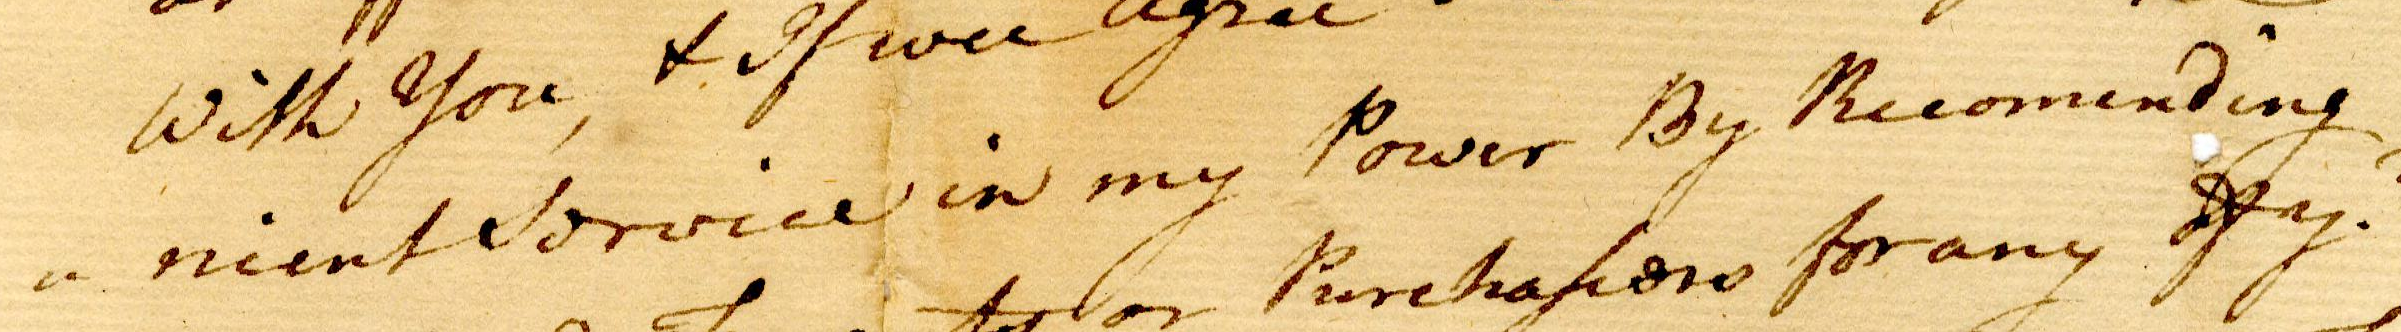-nient service in my Power by Recomending
